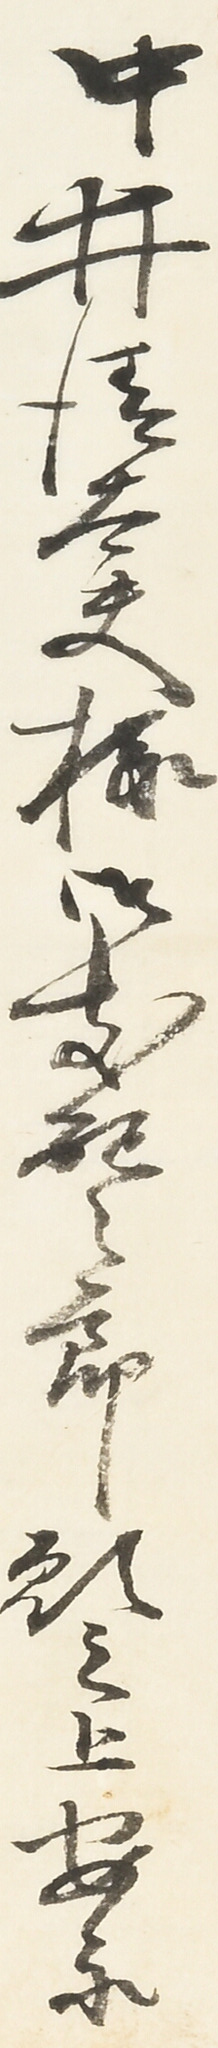中井清太夫様御支配之節願之上安永
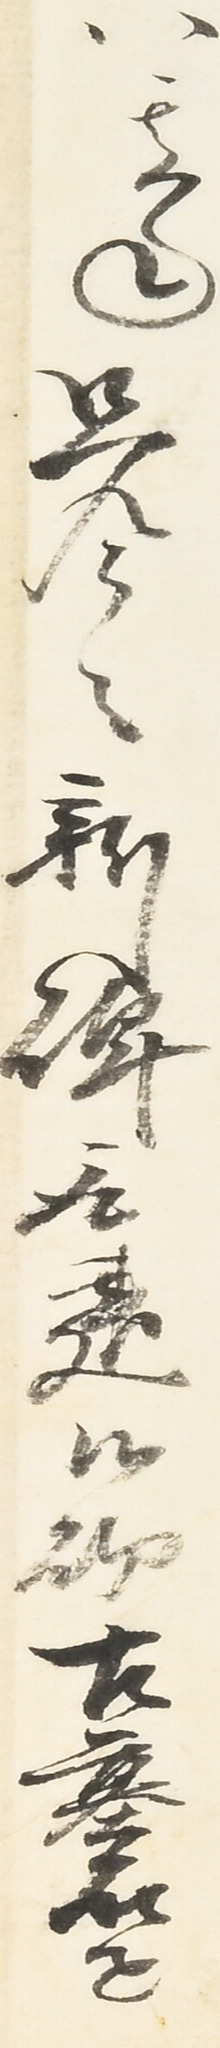八亥年只今之新碑取建候砌古墓石を

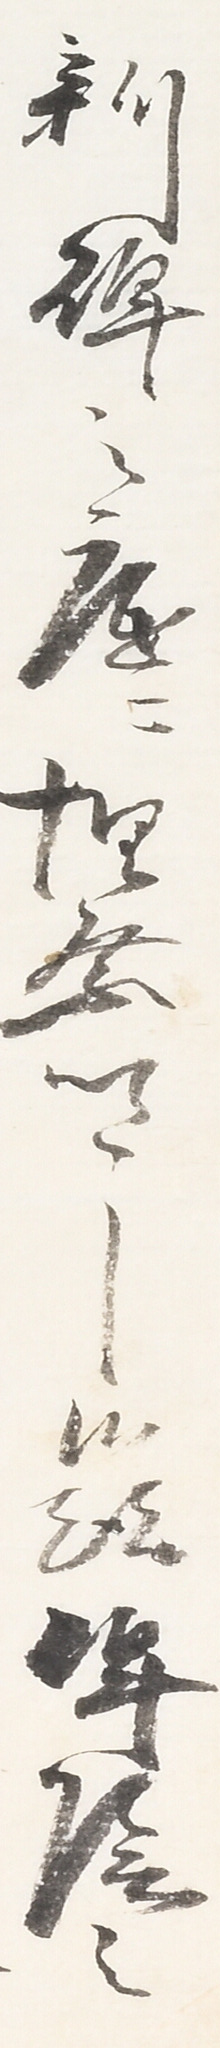新碑之底ニ埋祭いたし候趣碑陰之
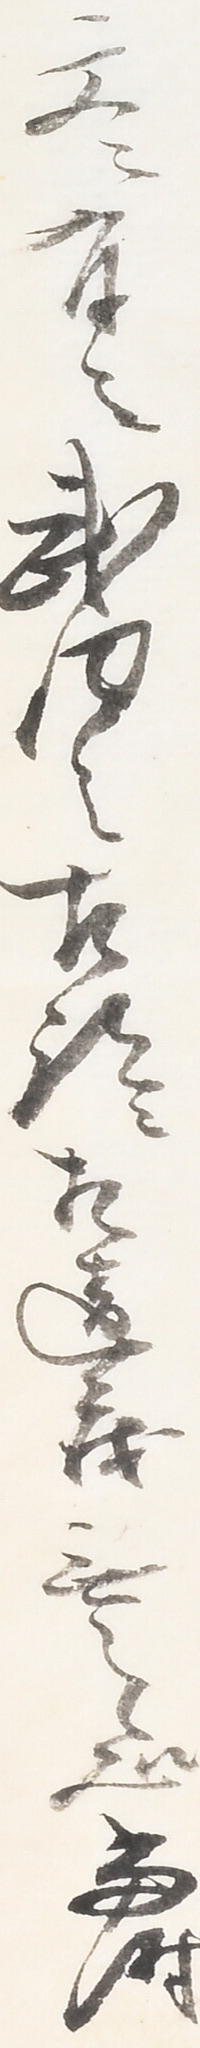文ニ有之武田之古跡ニ相違も無之処当時
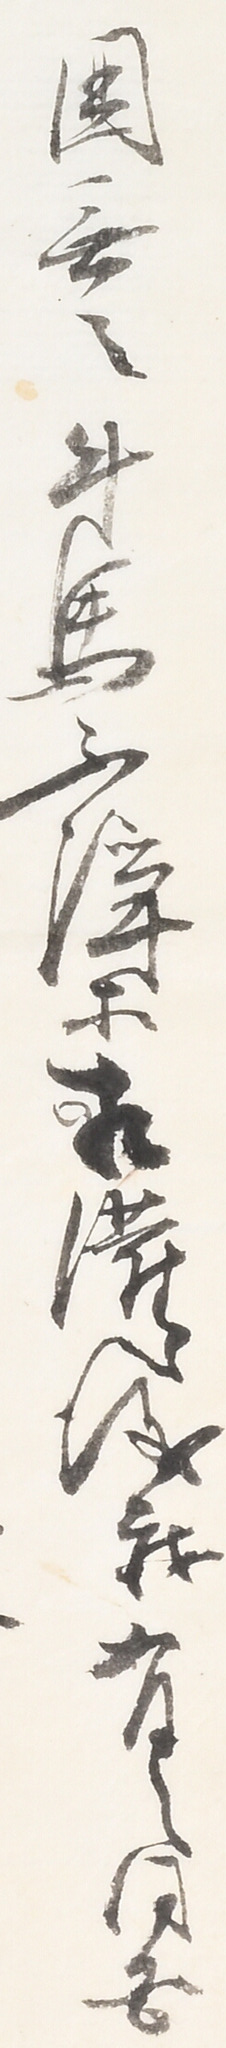囲無之牛馬不浄等相灌候儀も有之同国
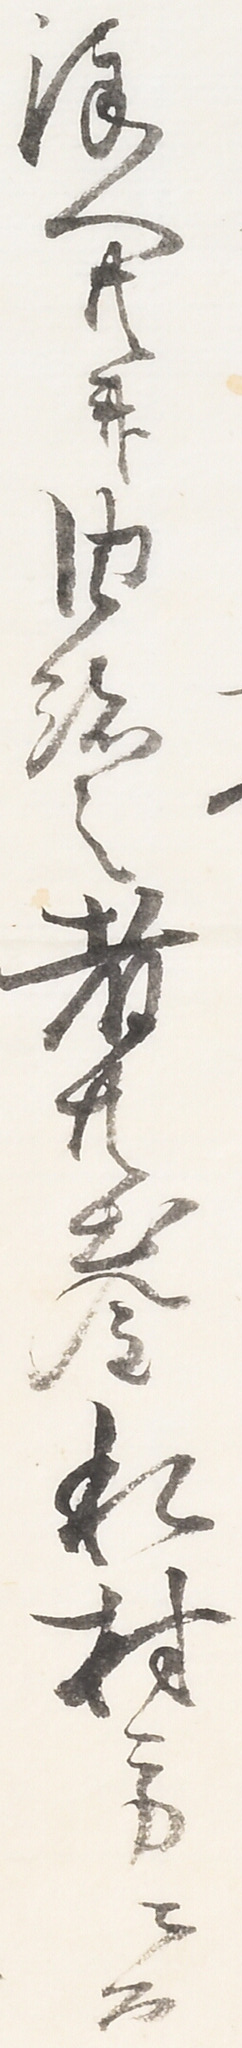浪人共幷由緒之者共出金私村方ニ而
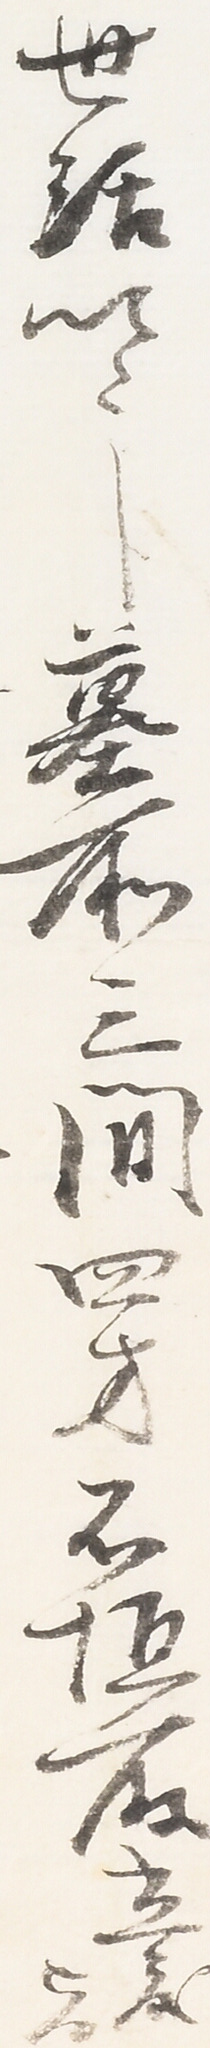世話いたし墓所三間四方石垣取立度旨
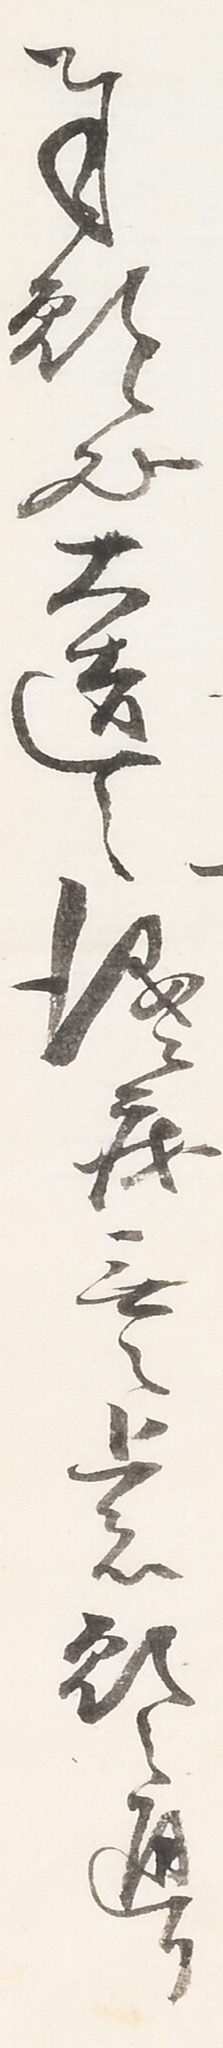奉願候処大造之儀ニも無之上は願之通り
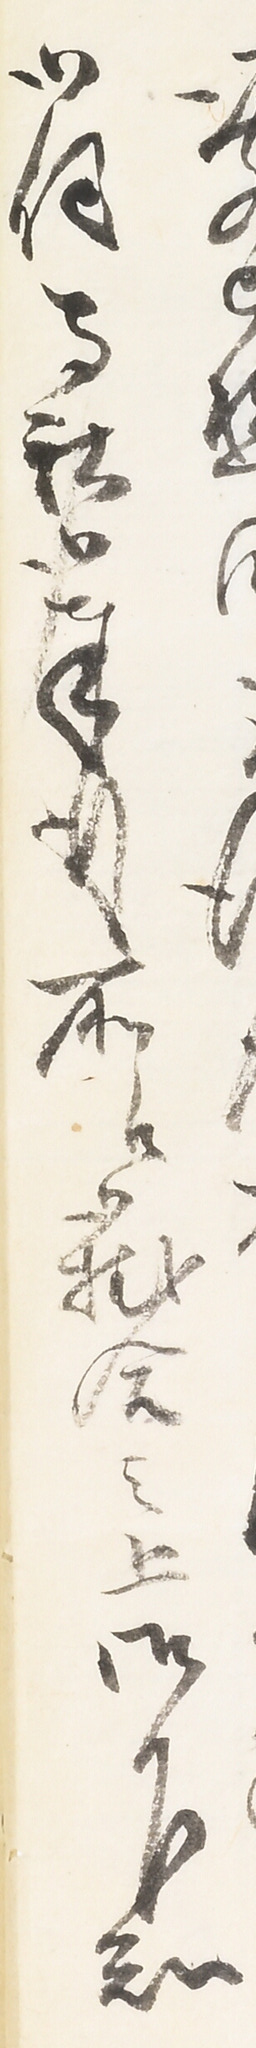御伺寺社御奉行所え御掛合之上御下知
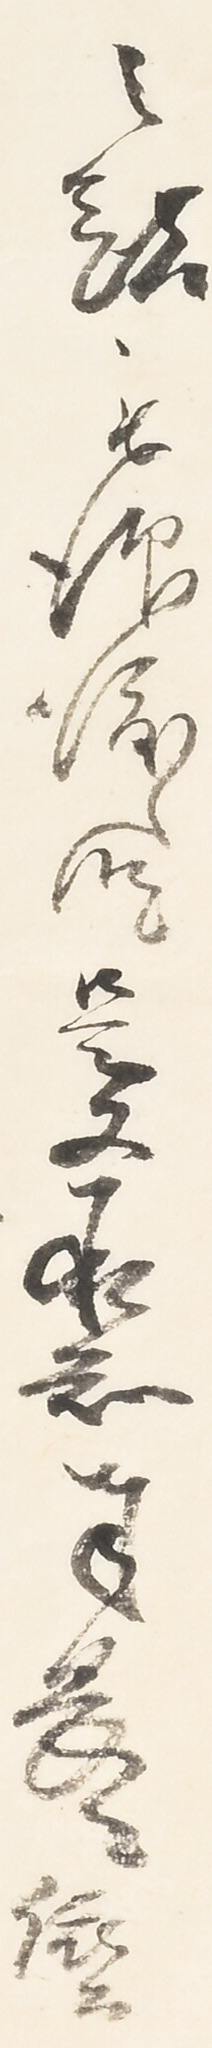之趣被仰渡候段是又承知奉畏ニ依而
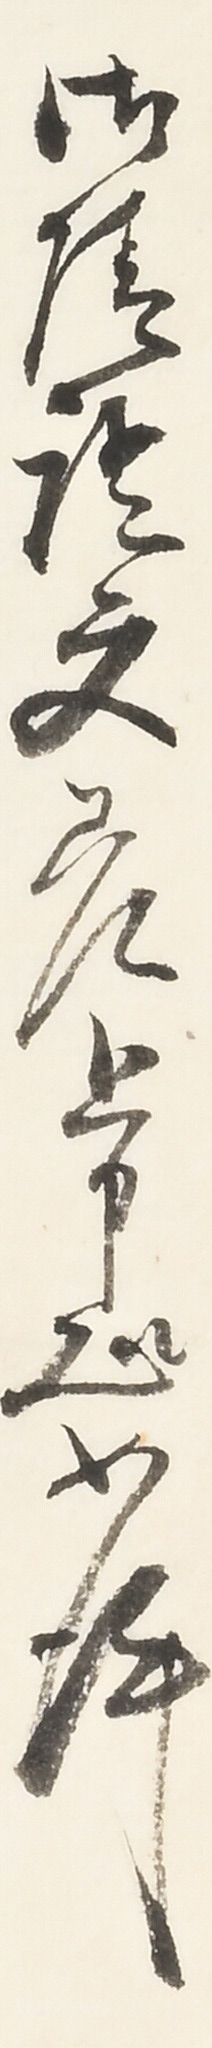御請証文差上申処如件
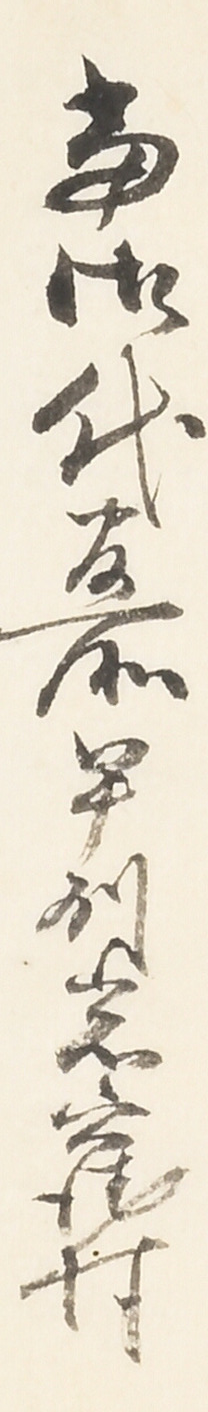当御代官所甲州岩窪村
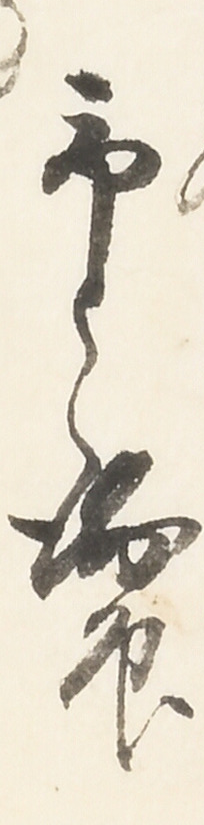市兵衛印
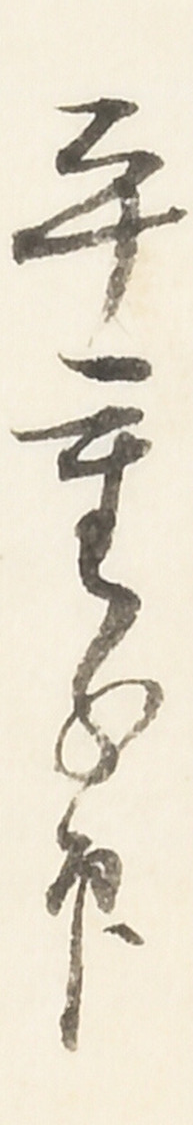平重郎印
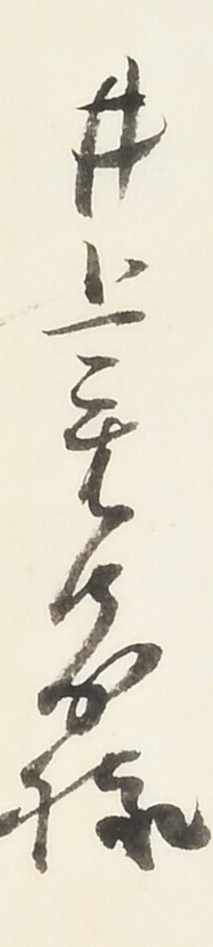井上重蔵様
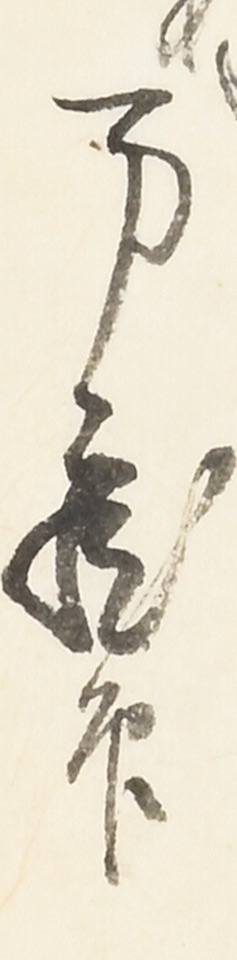万蔵印
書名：岩窪廟取（所）墓碑囲石垣取建伺書
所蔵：伊那市立高遠町図書館・合同会社AMANE
